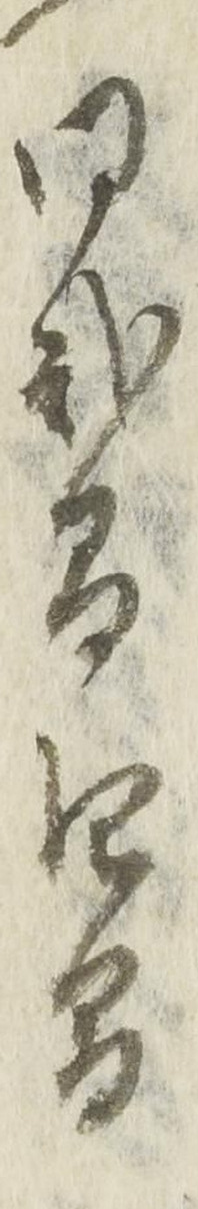同弐間四間
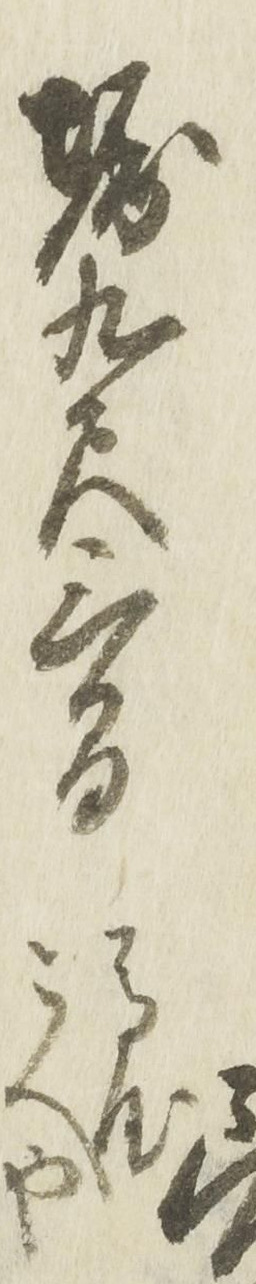堀九尺三間儀助
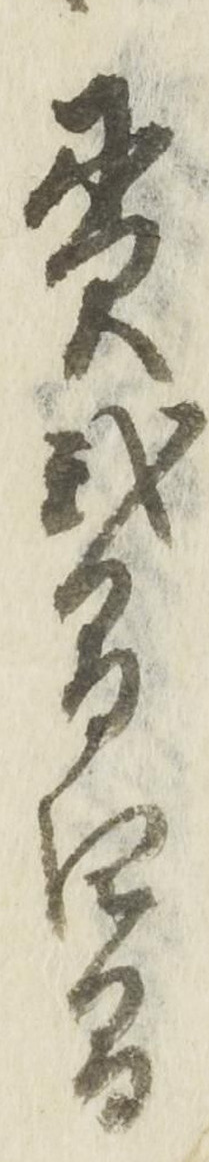同弐間四間
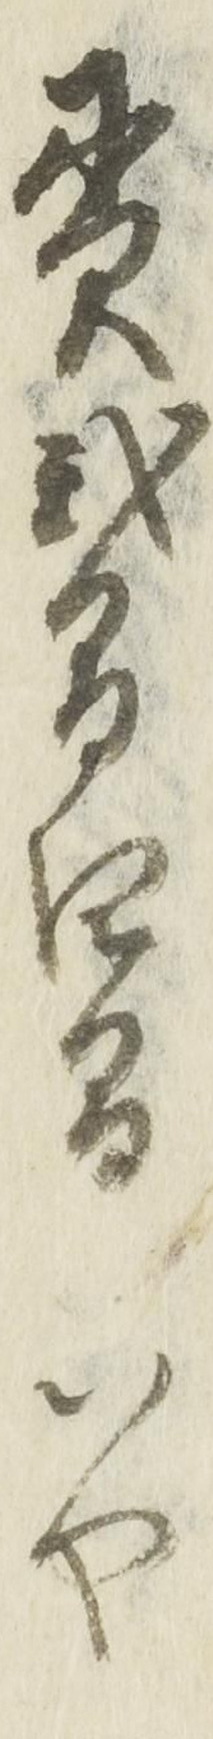貫弐間四間いや
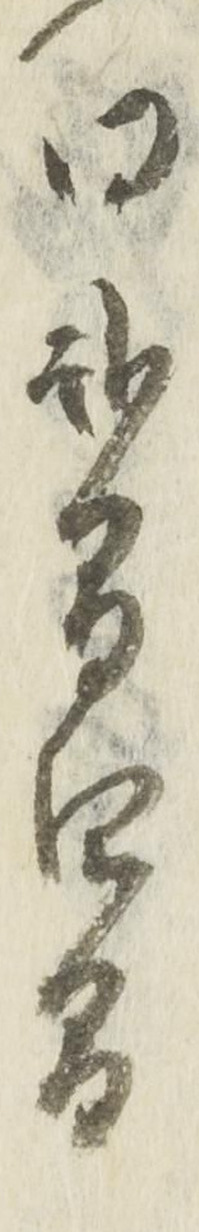同弐間四間
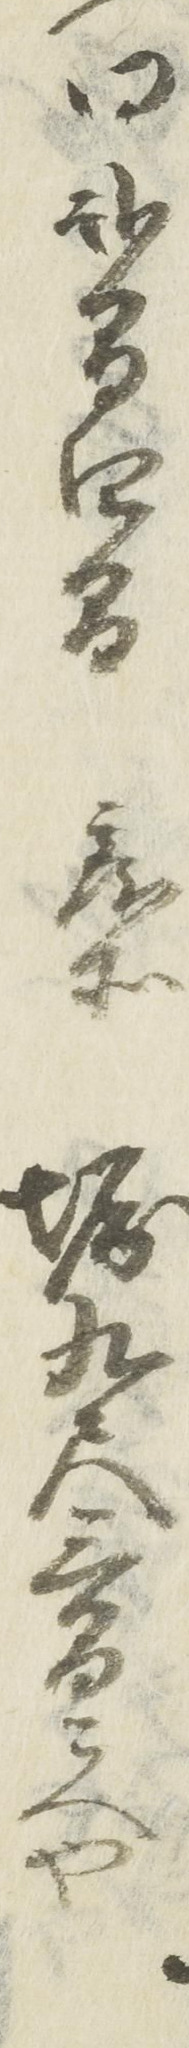同弐間四間台所同九尺三間馬屋こへや
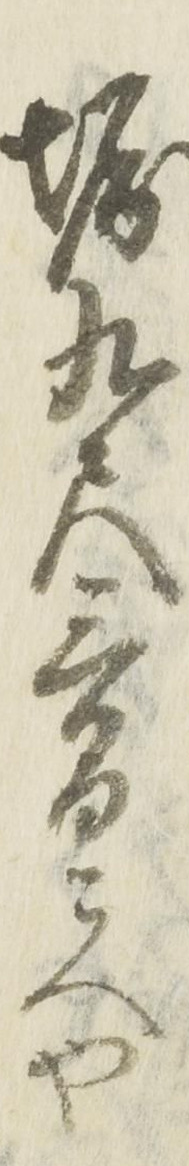堀九尺三間儀助
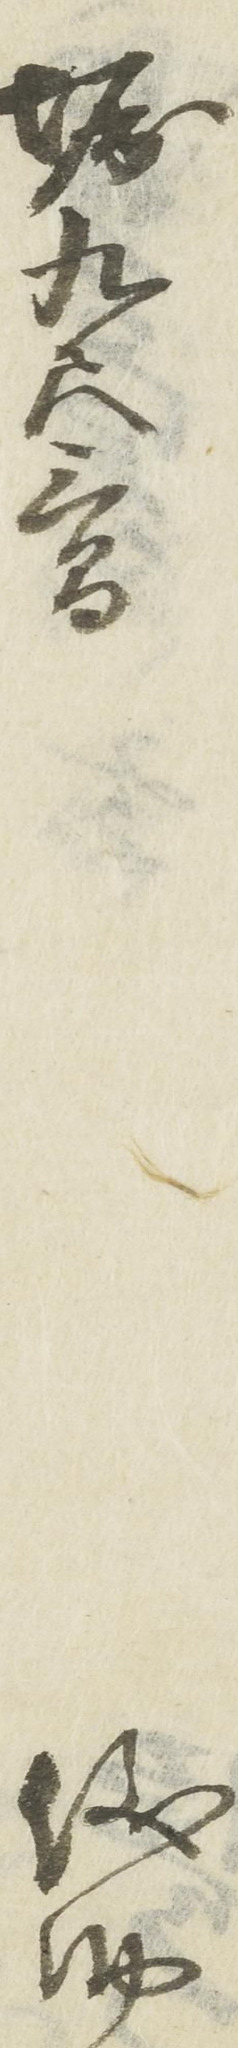堀九尺三間儀助
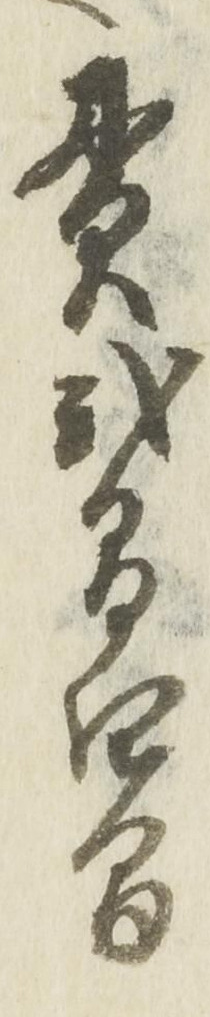同弐間四間
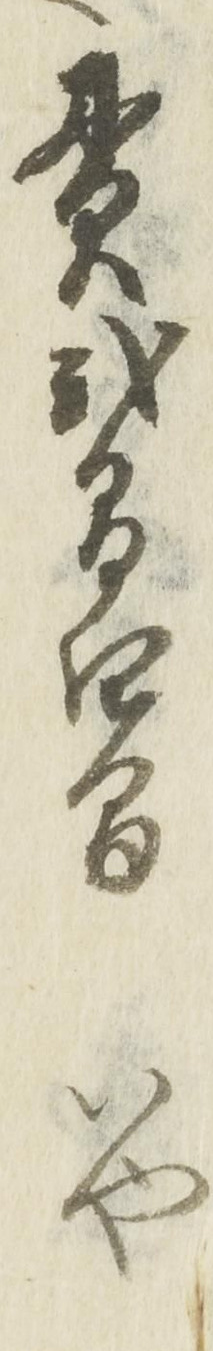貫弐間四間いや
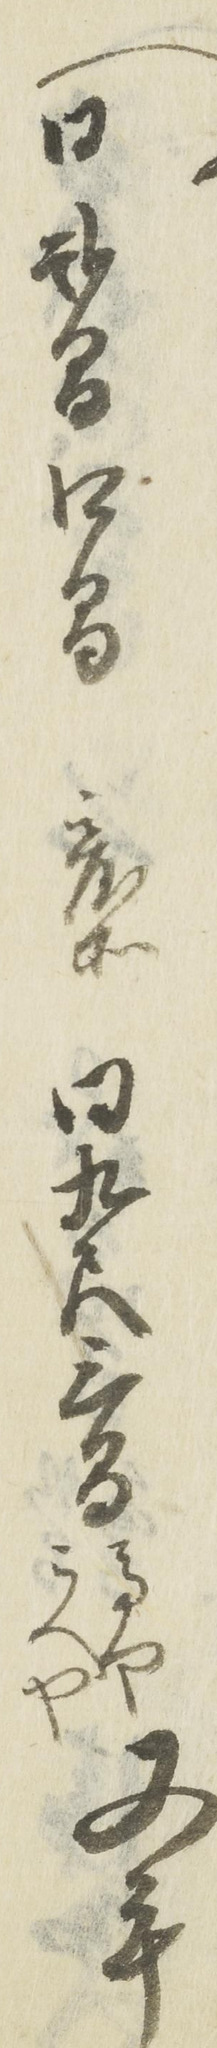同弐間四間台所同九尺三間馬やこへや又平
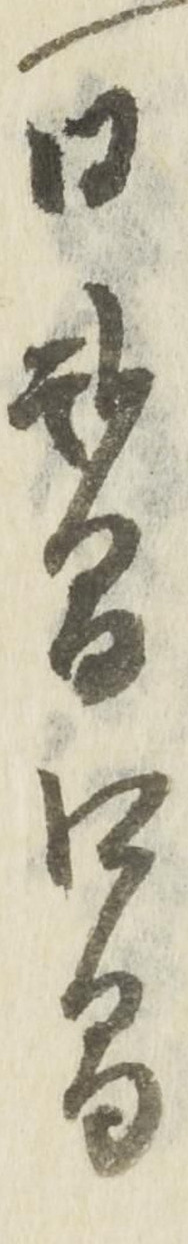同弐間四間
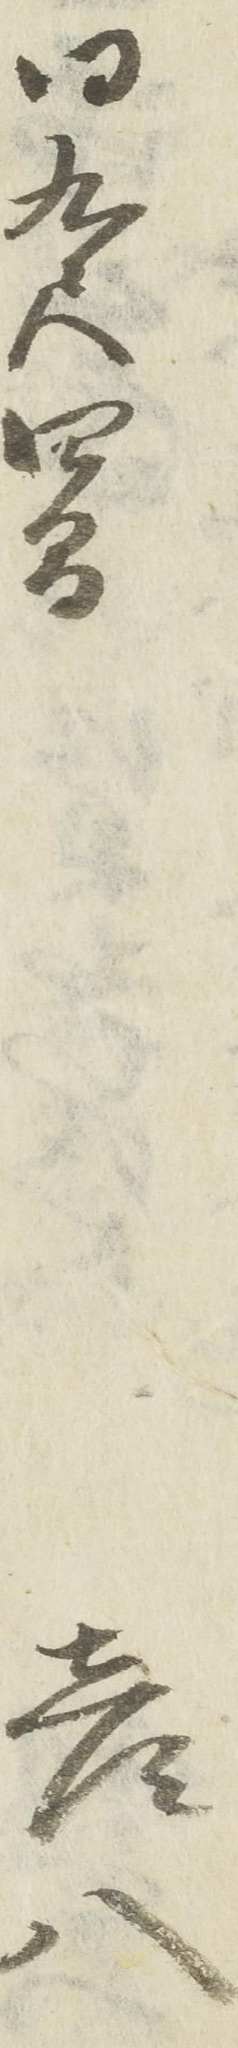同九尺四間彦八
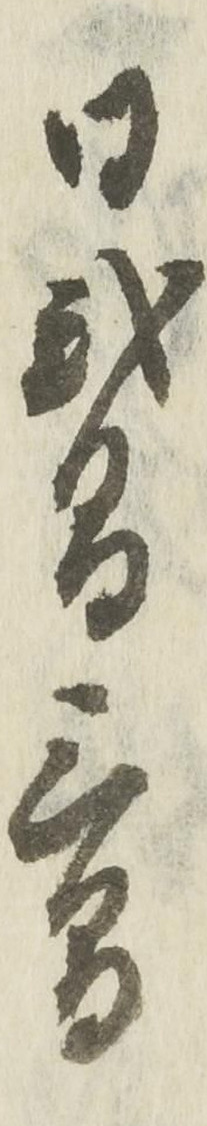同弐間四間
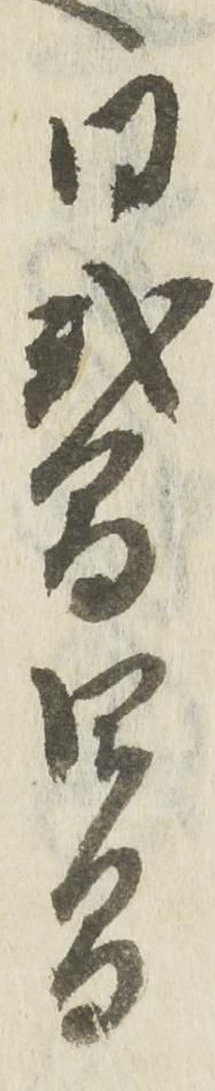同弐間四間
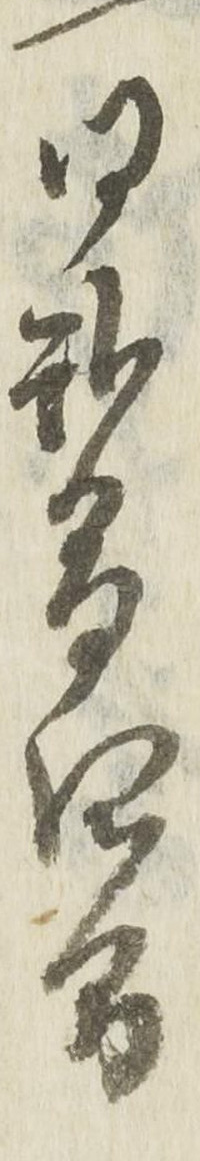同弐間四間
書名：後見笑
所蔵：東京大学地震研究所図書室 Earthquake Research Institute Library, The University of Tokyo, JAPAN
